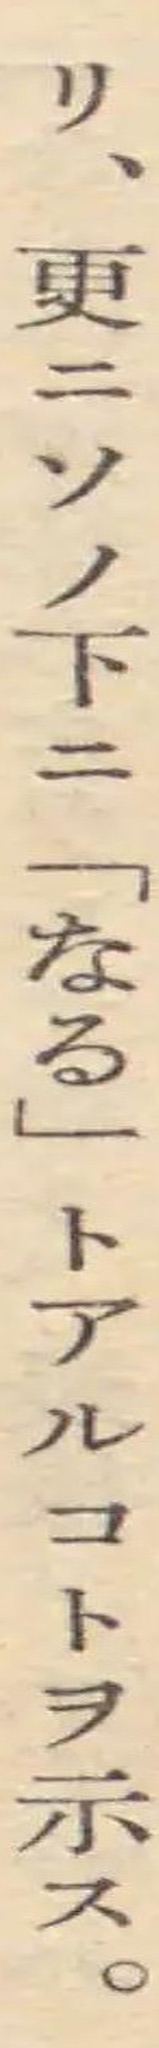リ、更ニソノ下ニ「なる」トアルコトヲ示ス。
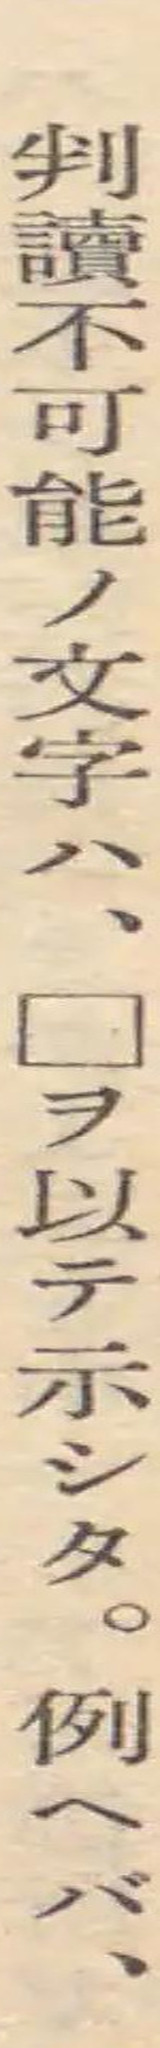一判読不可能ノ文字ハ、▢ヲ以テ示シタ。例ヘバ、
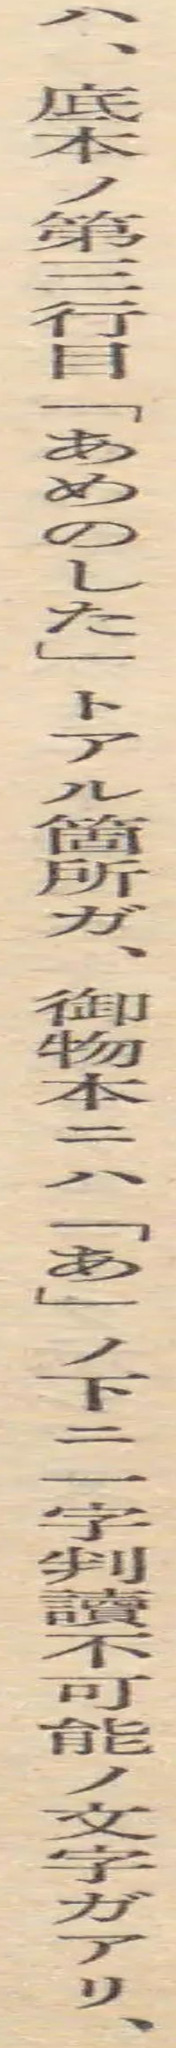ハ、底本ノ第三行目「あめのした」トアル箇所ガ、御物本ニハ「あ」ノ下ニ一字判読不可能ノ文字ガアリ、
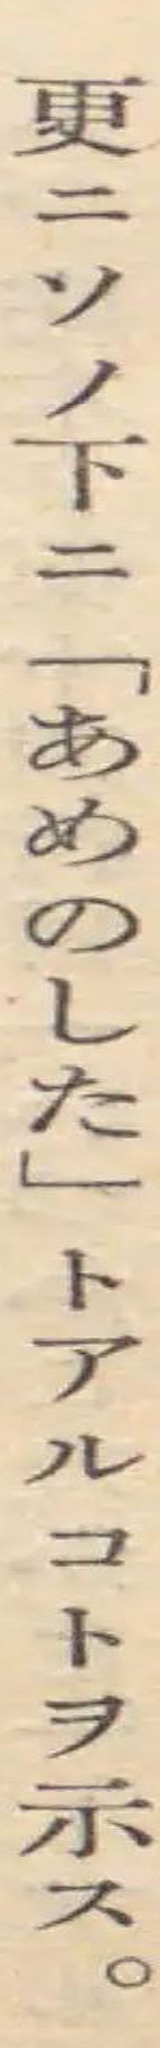更ニソノ下ニ「あめのした」トアルコトヲ示ス。
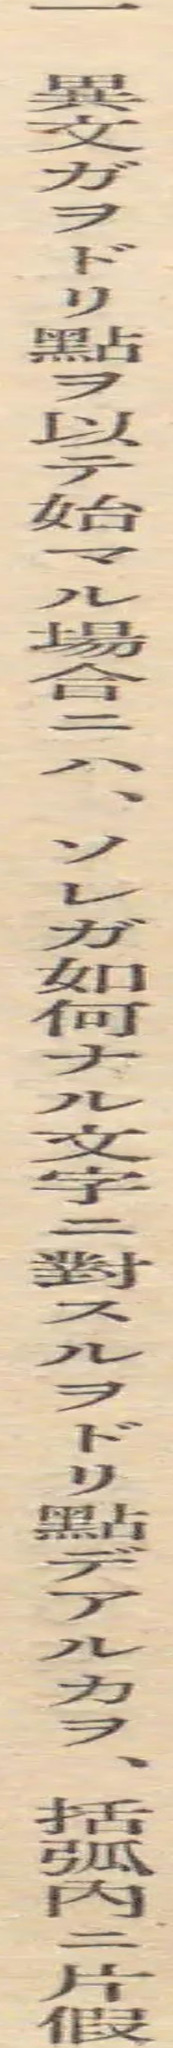一異文ガヲドリ点ヲ以テ始マル場合ニハ、ソレガ如何ナル文字ニ対スルヲドリ点デアルカヲ、括弧内ニ片仮
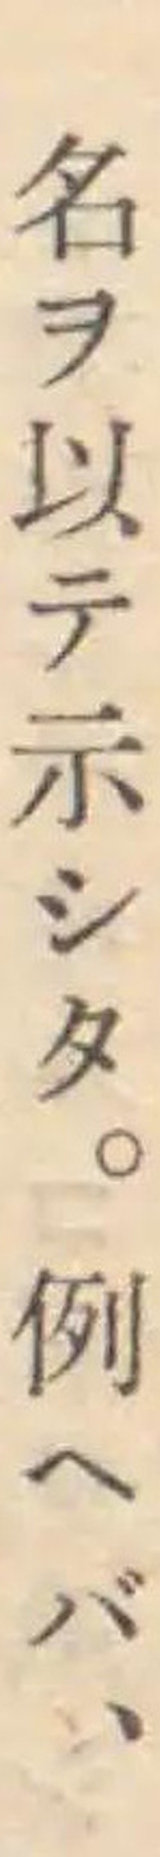名ヲ以テ示シタ。例へバ、
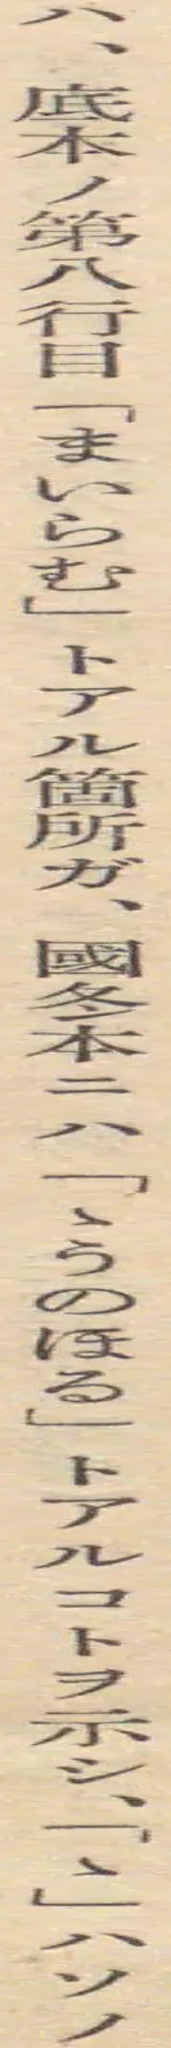ハ、底本ノ第八行目「まいらむ」トアル箇所ガ、国冬本ニハ「ゝうのほる」トアルコトヲ示シ、「ゝ」ハソノ
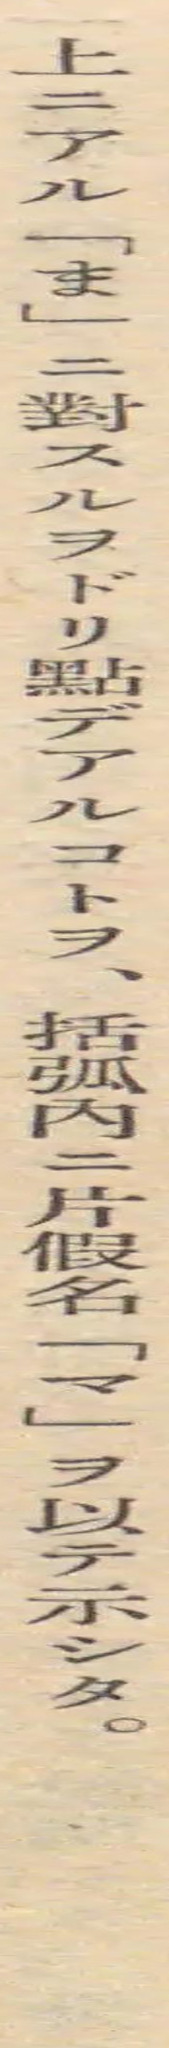上ニアル「ま」ニ対スルヲドリ点テアルコトヲ、括弧内ニ片仮名「マ」ヲ以テ示シタ。

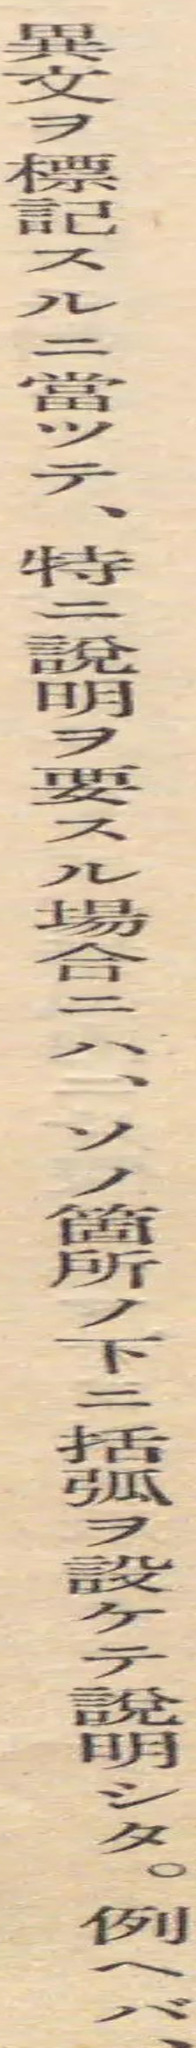一異文ヲ標記スルニ当ツテ、特ニ説明ヲ要スル場合ニハ、ソノ箇所ノ下ニ括弧ヲ設ケテ説明シタ。例ヘバ、
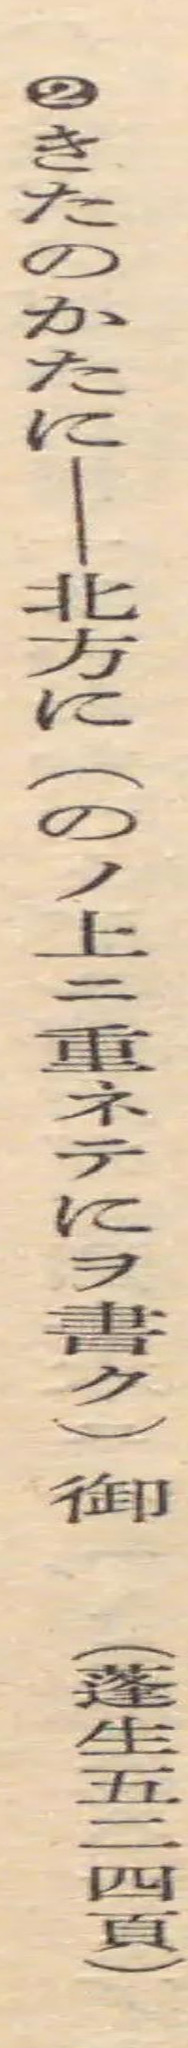➋きたのかたに──北方に(のノ上ニ重ネテにヲ書ク)御(蓬生五二四頁)
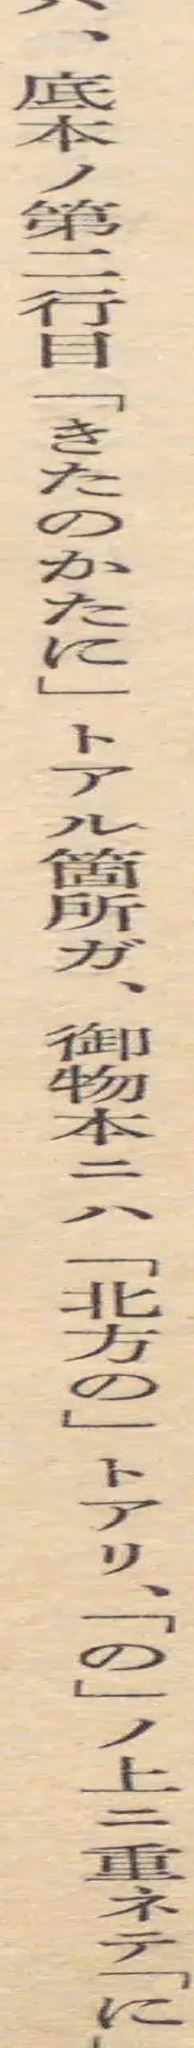ハ、底本ノ第二行目「きたのかたに」トアル箇所ガ、御物本ニハ「北方の」トアリ、「の」ノ上ニ重ネテ「に」
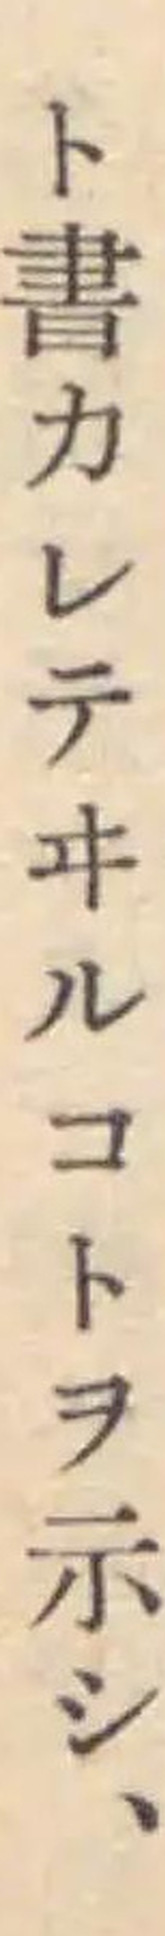ト書カレテヰルコトヲ示シ、
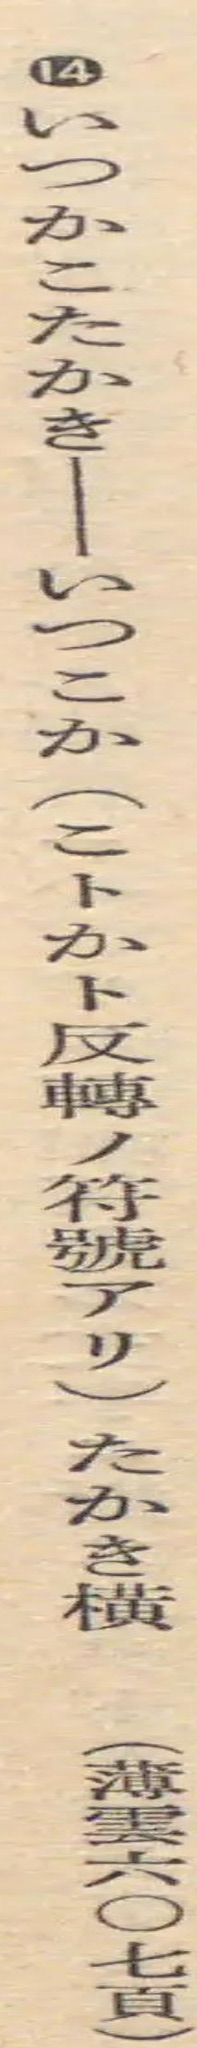⓮いつかこたかき──いつこか(こトかト反転ノ符号アリ)たかき横(薄雲六〇七頁)
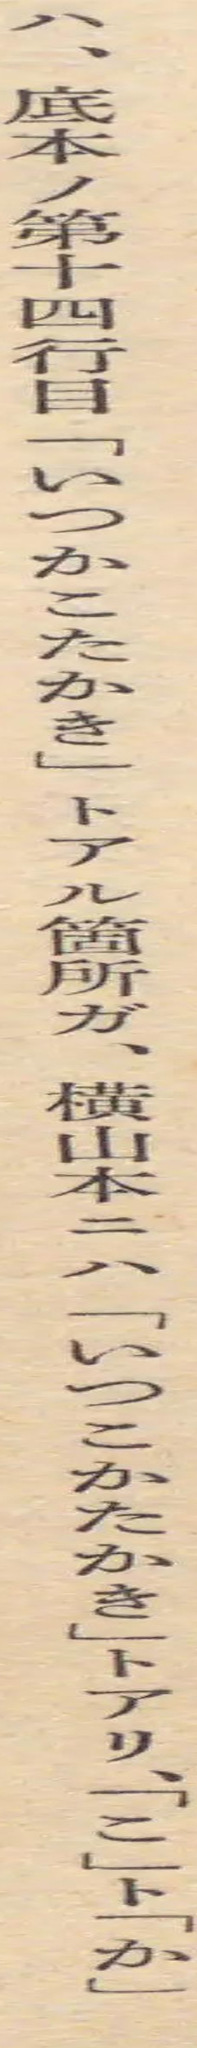ハ、底本ノ第十四行目「いつかこたかき」トアル箇所ガ、横山本ニハ「いつこかたかき」トアリ、「こ」ト「か」
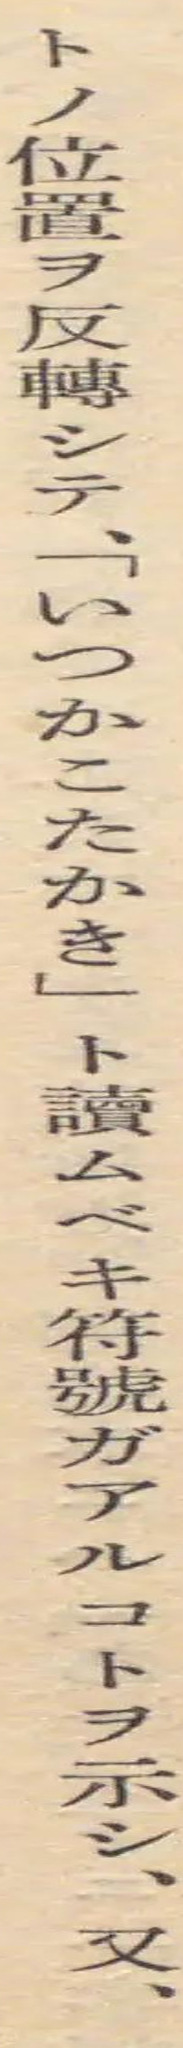トノ位置ヲ反転シテ、「いつかこたかき」ト読ムベキ符号ガアルコトヲ示シ、又、
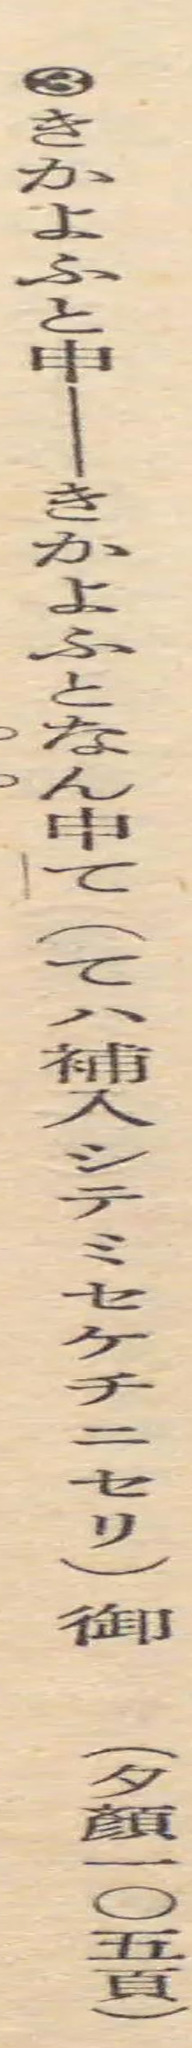❸きかよふと申──きかよふよとなん申て(てハ補人シテミセケチニセリ)御(夕顔一〇五頁)
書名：校異源氏物語.
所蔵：国立国会図書館 National Diet Library, JAPAN
